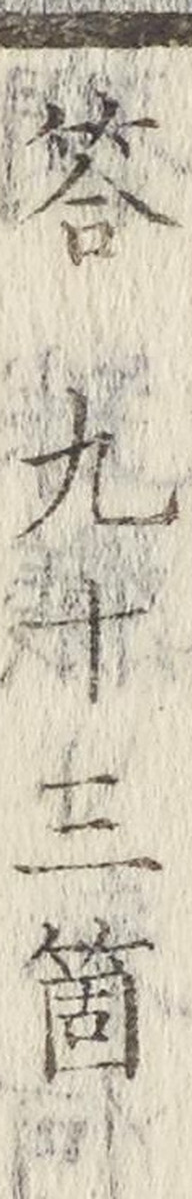答九十三箇
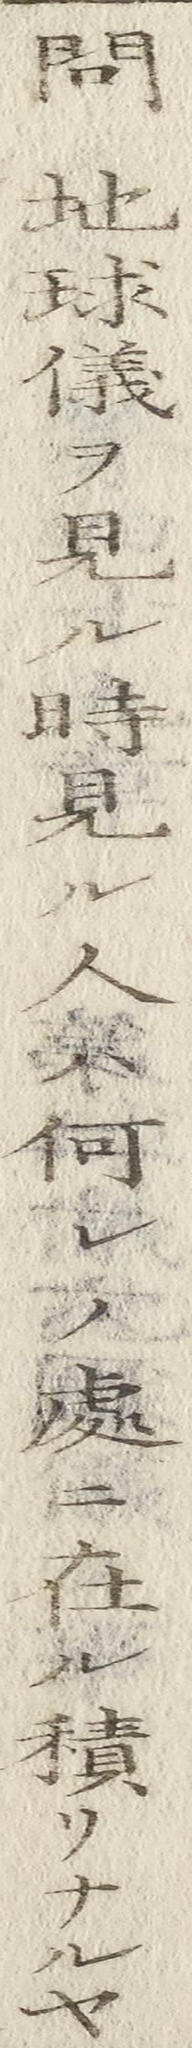問地球儀ヲ見ル時見ル人ハ何レノ処ニ在ル積リナルヤ
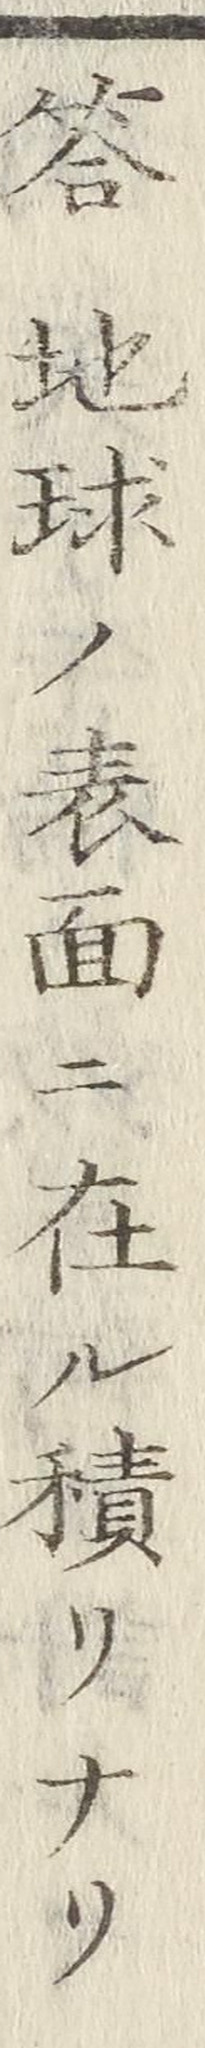答地球ノ表面ニ在ル積リナリ
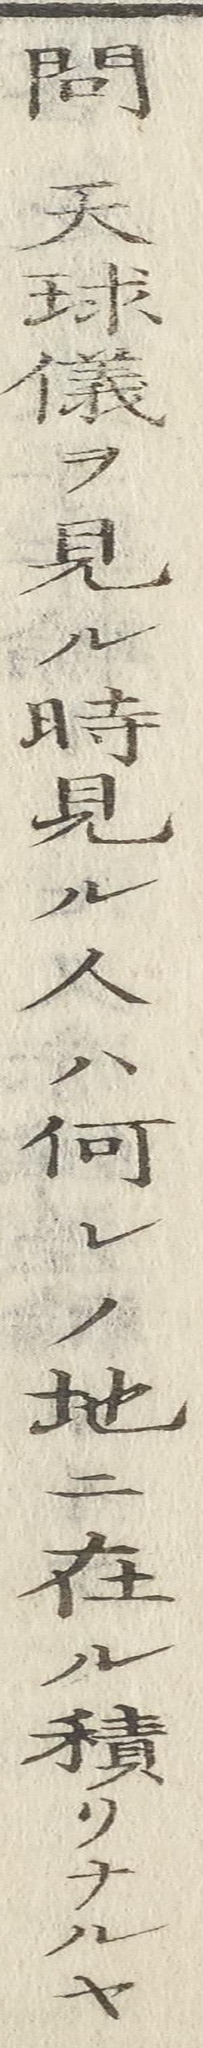問天球儀ヲ見ル時見ル人ハ何レノ地ニ在ル積リナルヤ
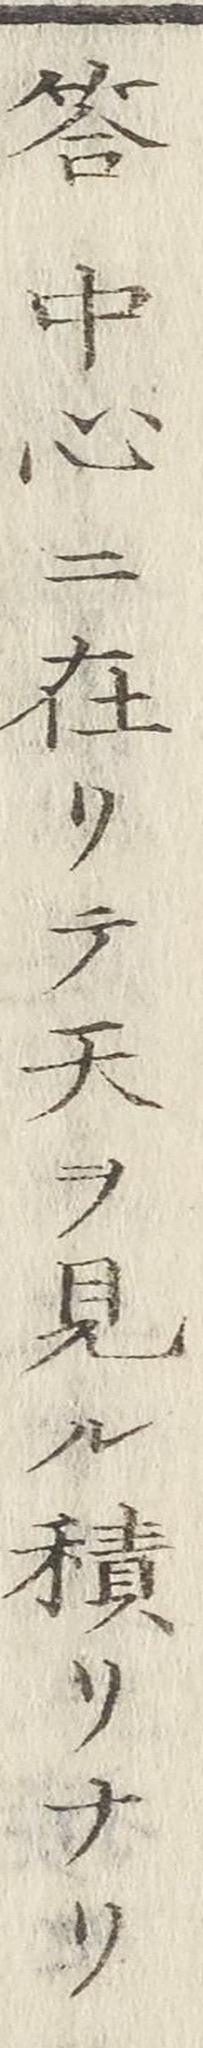答中心ニ在リテ天ヲ見ル積リナリ
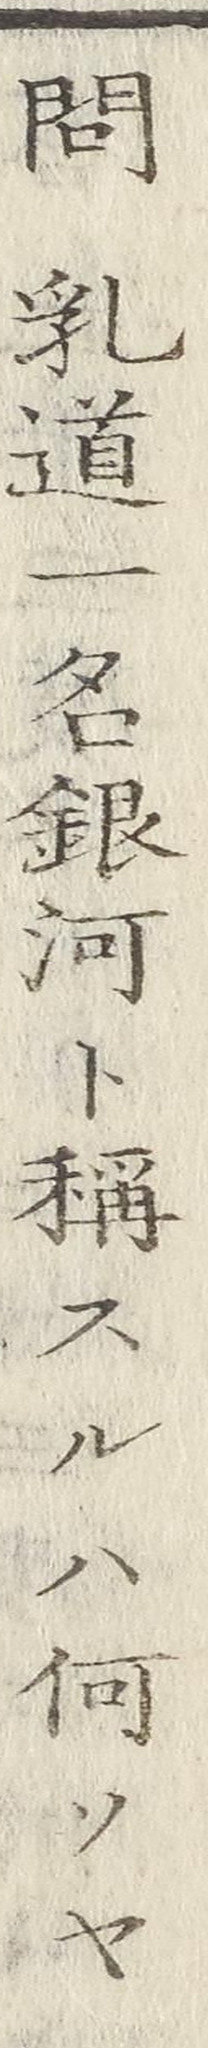問乳道一名銀河ト称スルハ何ソヤ
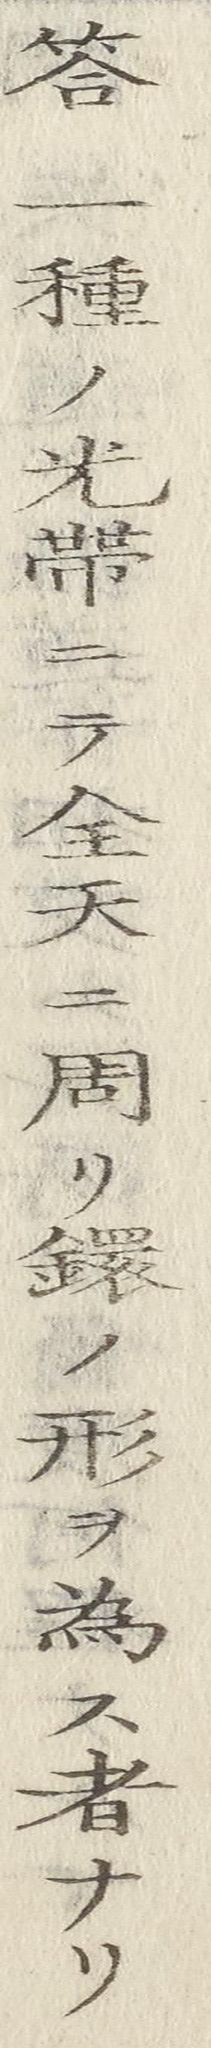答一種ノ光帯ニテ全天ニ周リ鐶ノ形ヲ為ス者ナリ
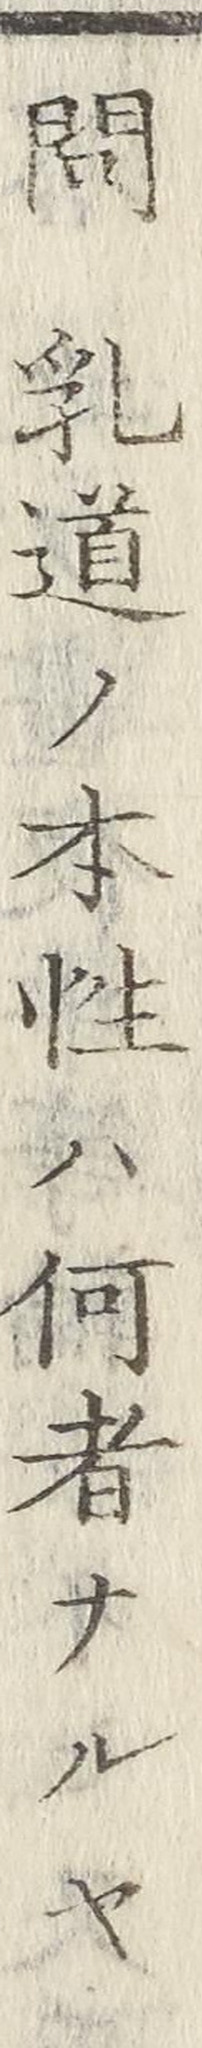問乳道ノ本性ハ何者ナルヤ
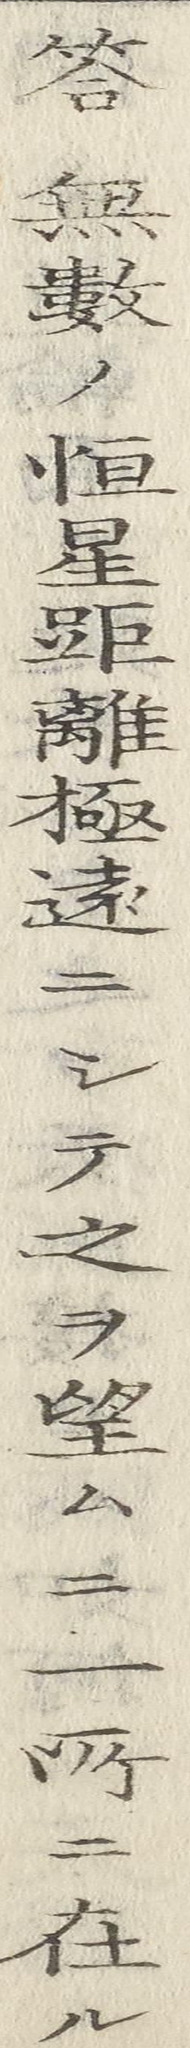答無数ノ恒星距離極遠ニシテ之ヲ望ムニ一所ニ在ル
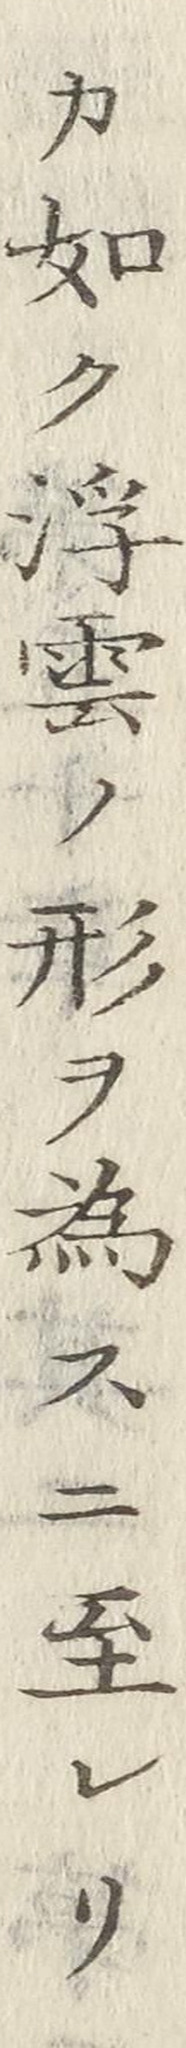カ如ク浮雲ノ形ヲ為スニ至レリ
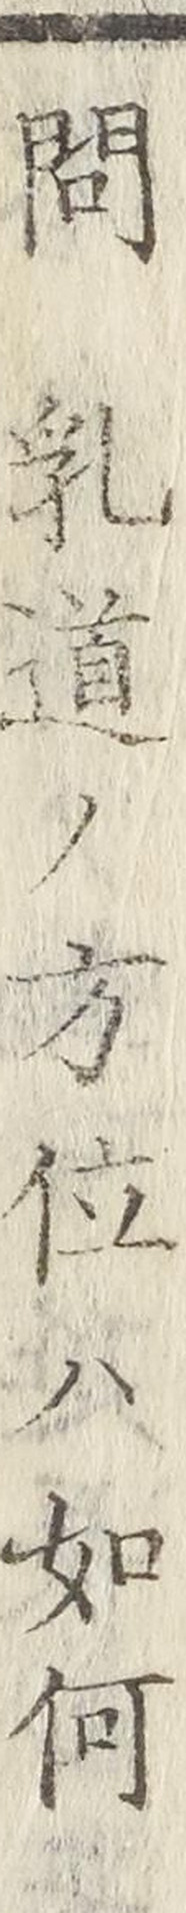問乳道ノ方位ハ如何
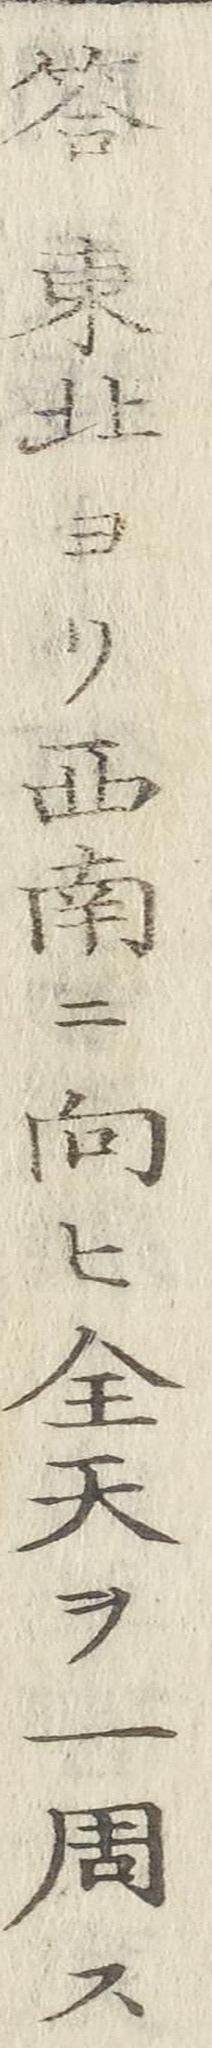答東北ヨリ西南ニ向ヒ全天ヲ一周ス

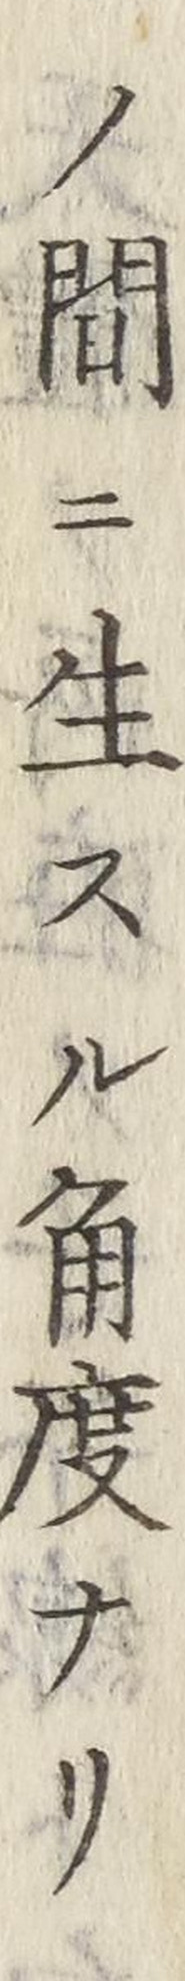ノ間ニ生スル角度ナリ
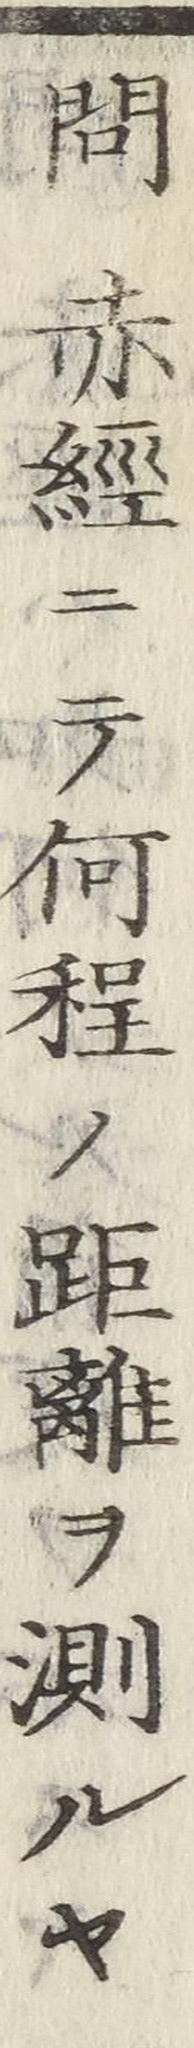問赤経ニテ何程ノ距離ヲ測ルヤ
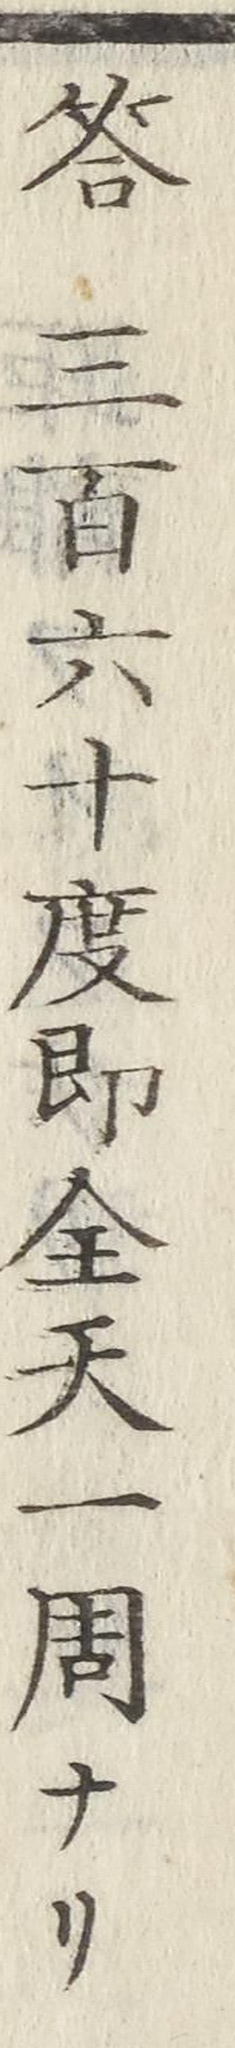答三百六十度即全天一周ナリ
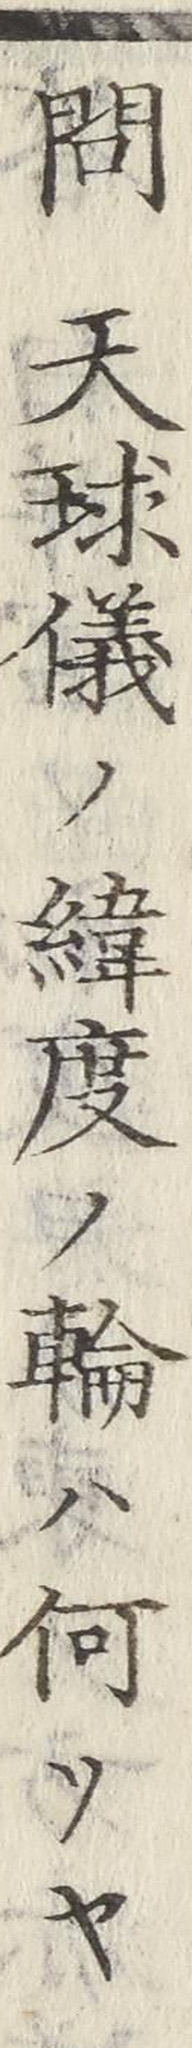問天球儀ノ緯度ノ輪ハ何ソヤ
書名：星学圖説　下
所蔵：東京大学地震研究所図書室 Earthquake Research Institute Library, The University of Tokyo, JAPAN
